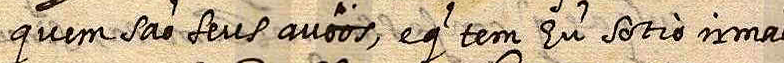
quem saõ seus avôos, e q̄ tem hū so tio irmaõ
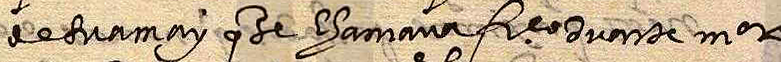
de sua may q̄ se chamaba fr.co duarte mor
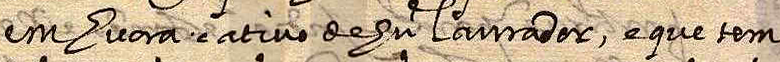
em Evora e ativo de hū lavrador, e que tem
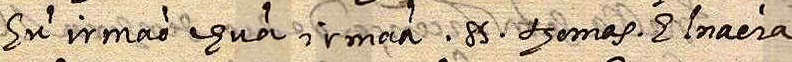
hū irmaõ e huā irmaã .ss. thomas e Inacia
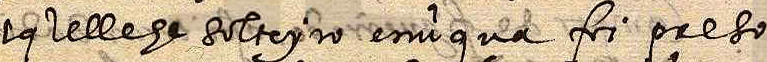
e q̄ elle he solteyro e nūqua foi preso
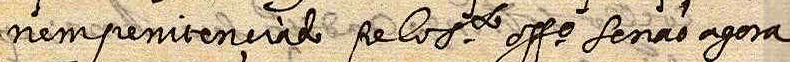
nem penitençiado pelo S.to off.o senaõ agora
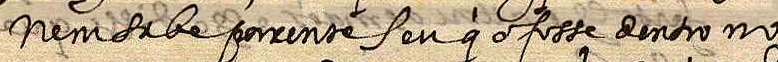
nem sabe parrente seu q̄ o fosse dentro no
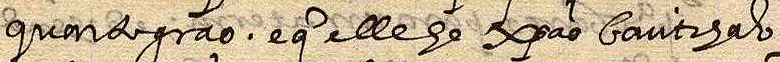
quarto grao. e q̄ elle he xpaõ bautizado
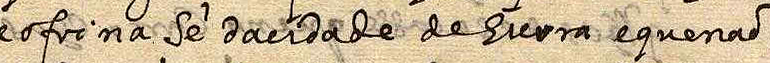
e o foi na Sé da cidade de Evora e que naõ
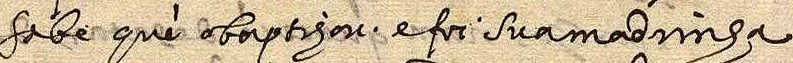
sabe quē o baptizou. e foi sua madrinha
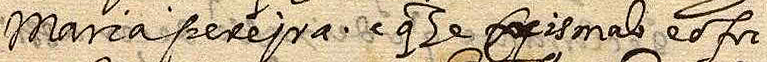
Maria perejra. e q̄ he crismado e o foi
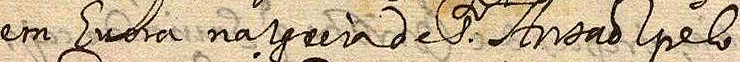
em Evora na igreia de S.to Antaõ pelo
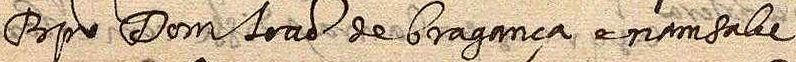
Bpō Dom Joaõ de bragança e nam sabe
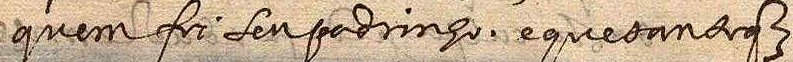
quem foi seu padrinho. e que tanto q̄
